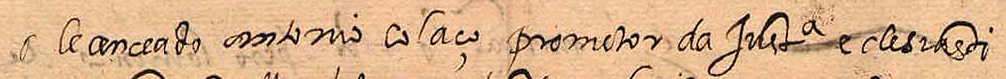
o lecenceado antonio colaço promotor da Justa eclesiasti
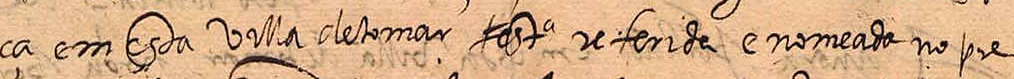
ça em esta villa de tomar testa referida e nomeada no pre
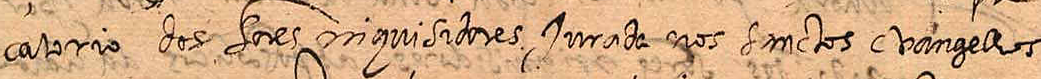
catorio dos So̅res inquisidores Jurada nos Sanctos evangelhos
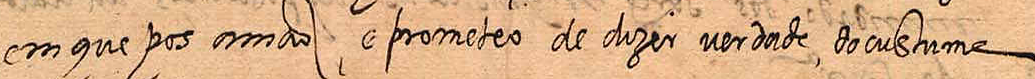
em que pos a mão, e prometeo de dizer uerdade, do custume
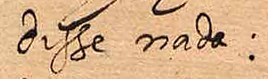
disse nada:
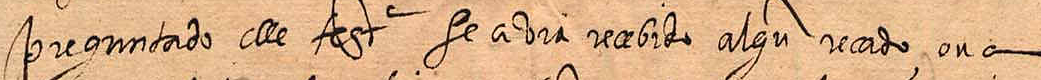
preguntado elle testa se avia recebido algu̅ recado, ou a
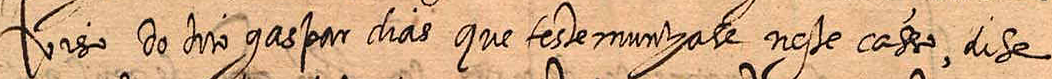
viso do dito gaspar dias que testemunhase neste casso, dise
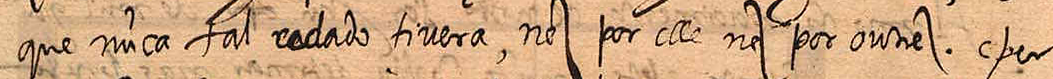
que nu̅ca tal recado tiuera, ne̅ por elle ne̅ por outre̅. e per
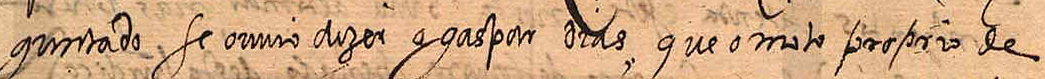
guntado se ouuio dizer a gaspar dias, que o moto proprio de
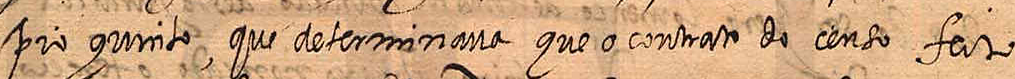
pio quinto, que determinaua que o contrato do censo feito
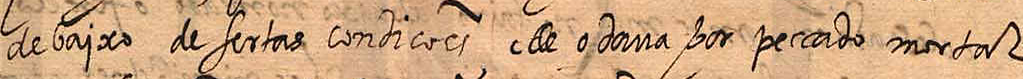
debajxo de sertas condicões, elle o daua por peccado mortal
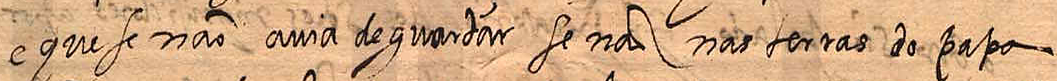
e que se não auia de guardar se não nas terras do papa
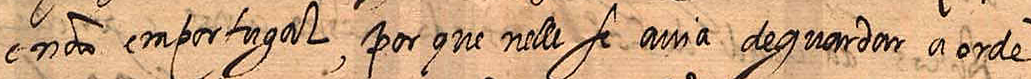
e não em portuguaL, por que nelle se auia de guardar a orde̅
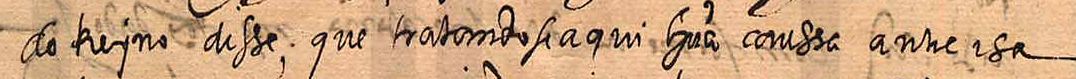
do Reyno disse que tratandose aqui hu̅a caussa antre isa
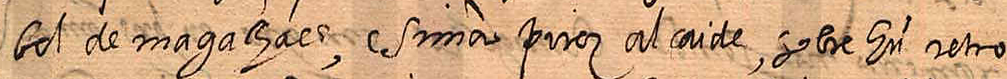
bel de magalhaes, e Simão pirez alcaide, sobre hu̅ retro
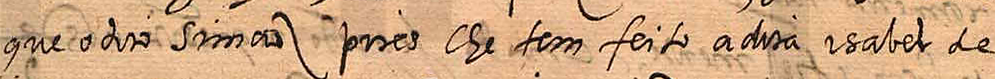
que o dito Simão pires lhe tem feito a dita isabel de
